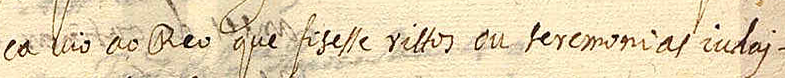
ca uio ao Reo que fisesse rittos ou seremonias iudaj
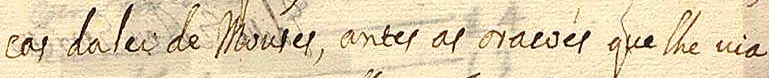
cas da lei de Mouses, antes as oracoẽs que lhe uia
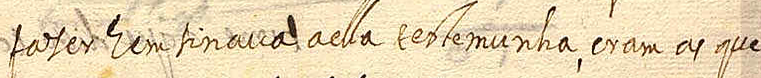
fazer E emsinaua a ella testemunha, eram as que
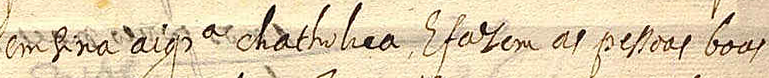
emsina a igra chatholica, E fazem as pessoas boas
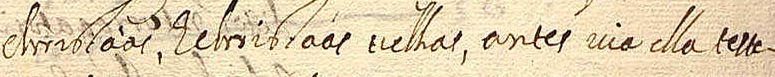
christāas, E christaās uelhas, antes uia ella teste
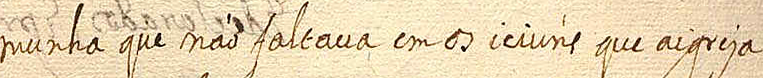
munha que não faltaua em os ieiuns que a igreja
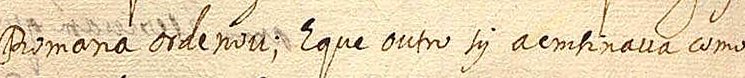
Romana ordenou; E que outrosy a emsinaua como
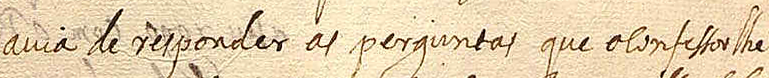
auia de responder as perguntas que o confessor lhe
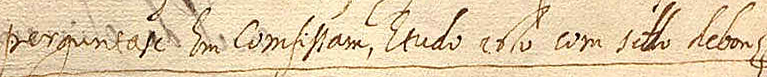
perguntase Em Comfissam, E tudo isto com sello de bon
